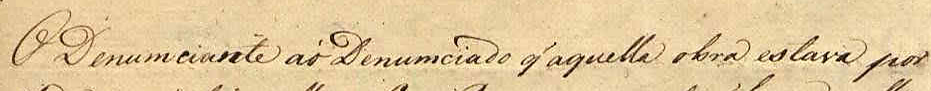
O Denunciante ao Denunciado q̄ aquella obra estava por
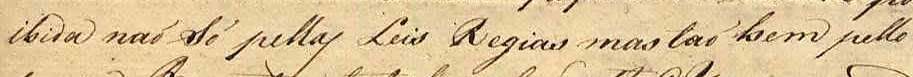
ibida naõ só pellas Leis Regias, mas taõbem pello
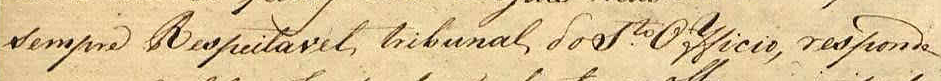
sempre Respeitavel, tribunal do S.to Officio, responde
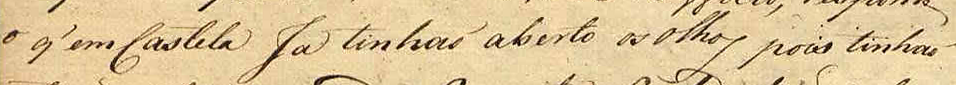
o q̄ em Castela Ja tinhaõ aberto os olhos pois tinhaõ
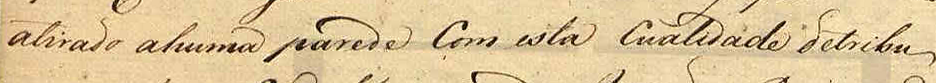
atirado a huma parede Com esta Cualidade de tribu
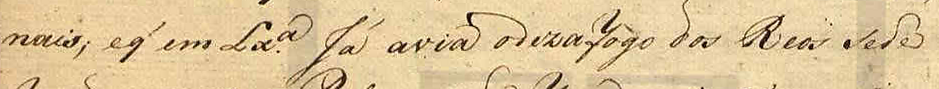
nais, e q̄ em Lx.a Já avia o dezafogo dos Reos se de
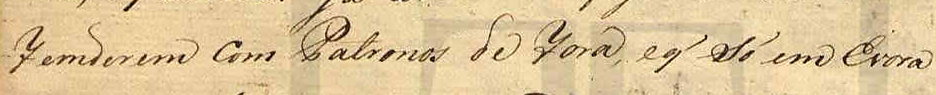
femderem com Patronos de fora, e q̄ Só em Evora
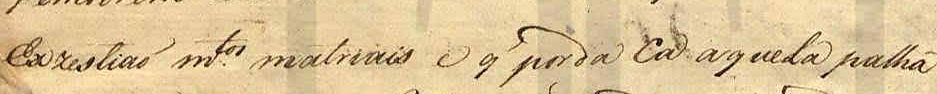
Exzestiaõ m.tos matriais e q̄ por da ca aquela palha
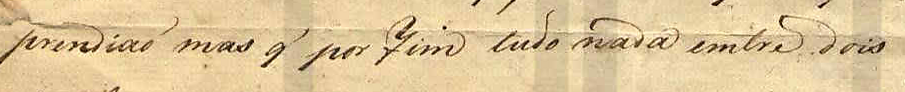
prendiaõ mas q̄ por fim tudo nada emtre dois
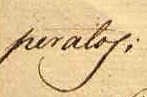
peratos.
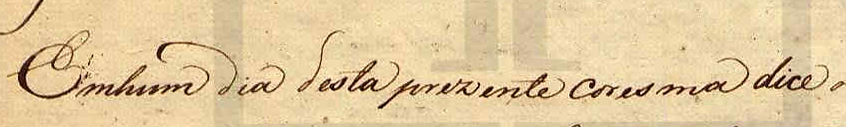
Em hum dia desta prezente coresma dice o
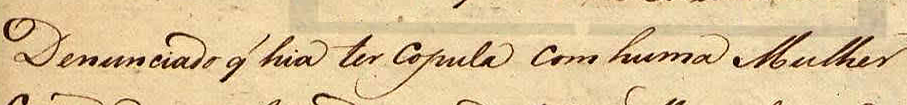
Denunciado q̄ hia ter copula com huma Mulher
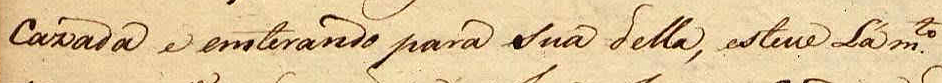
cazada e emterando para sua della, esteue Lá m.to
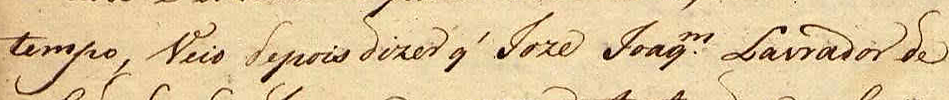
tempo, Veio depois dizer q̄ Ioze Ioaq.m Lavrador de
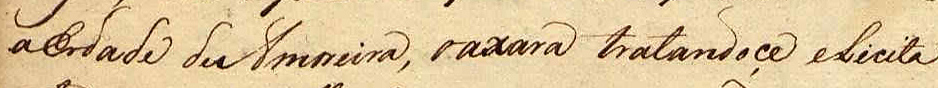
a Erdade de Amoreira, o axara tratandoce elicita
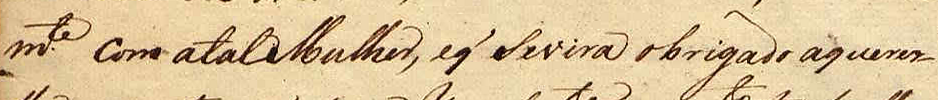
m.te com a tal Mulher, e q̄ se vira obrigado a querer
